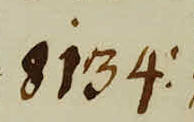8134
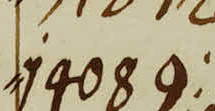14089
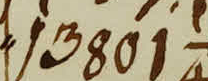13801
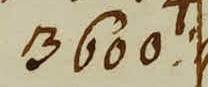3600.
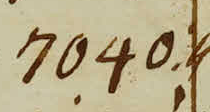7040.
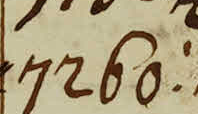7260
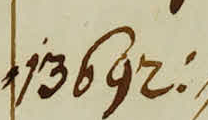13692
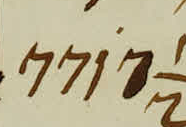7717
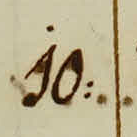10:
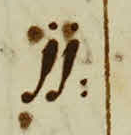11:
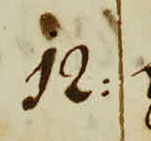12:
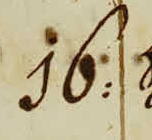16:
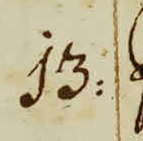13:
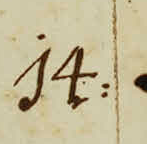14:
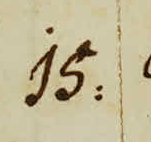15:
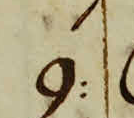9:
